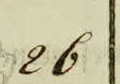26
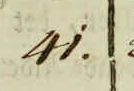41.
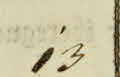13
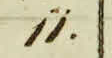11.
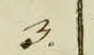3.
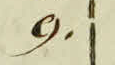9.
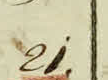21.
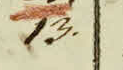13.
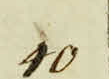40
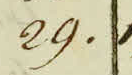29.
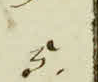5.
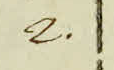2.
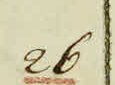26
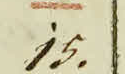15.
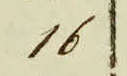16
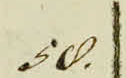58.
